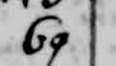69
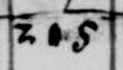205
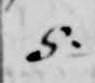5
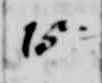15
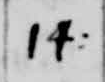14
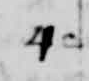4
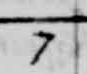7
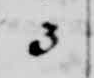3
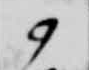9
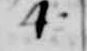4
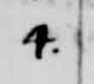4.
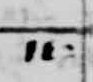11
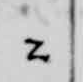2
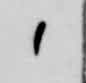1
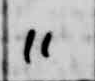11
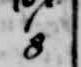8
